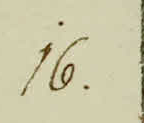16.
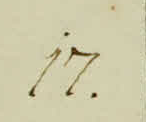17.
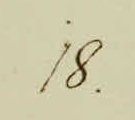18.
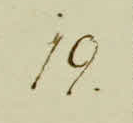19.
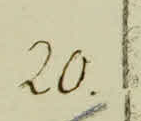20.
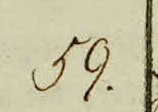59.
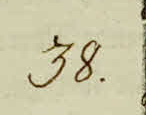38.
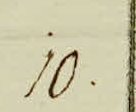10.
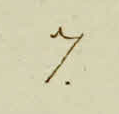7.
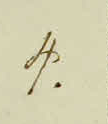4.
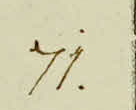71.
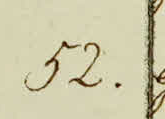52.
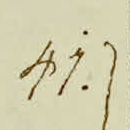41.
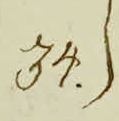34.
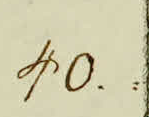40.
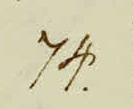74.
